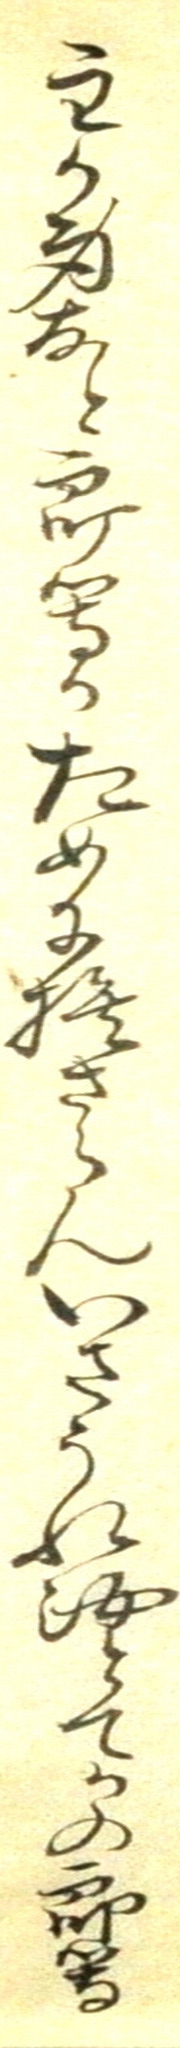主か身なと郎等かために捨さらんいさうれ汝とてかの郎等
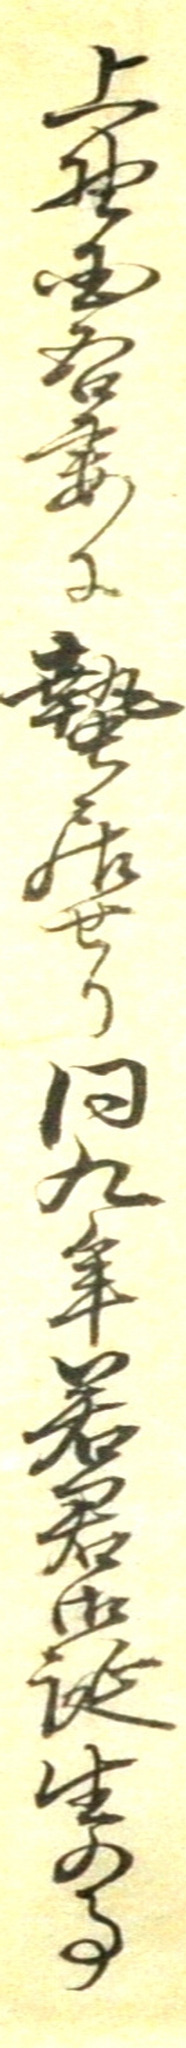上野国吾妻に蟄居せり同九年若君御誕生の事
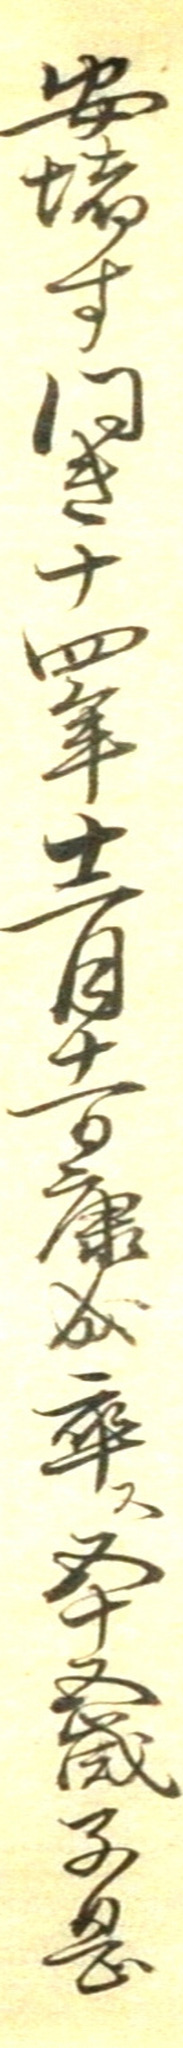安堵す同き十四年十二月十一日康成卒ス五十五歳子息
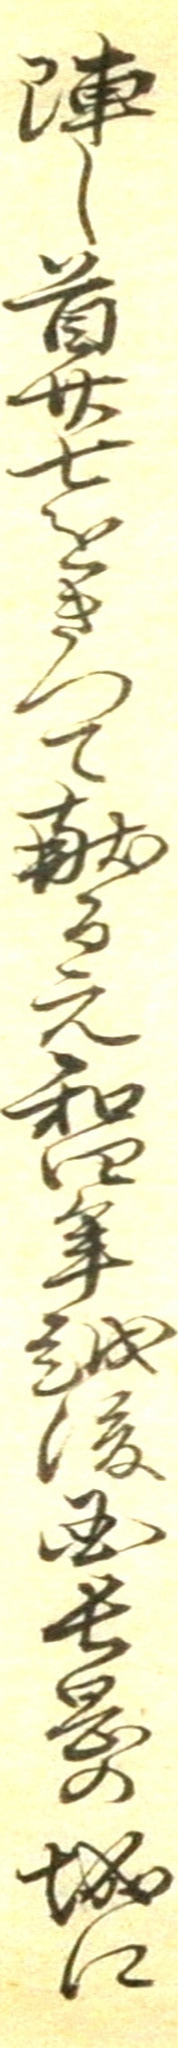陣し首廿七をきつて献る元和四年越後国長岡の城に
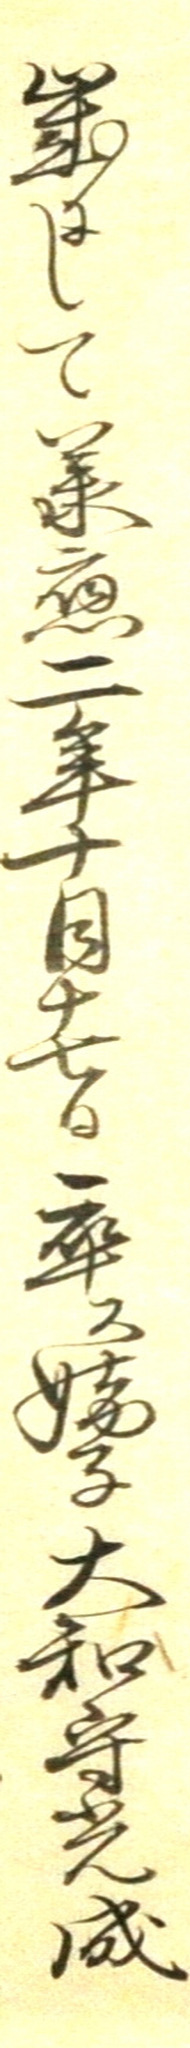歳にして承応二年十月十七日卒ス嫡子大和守光成
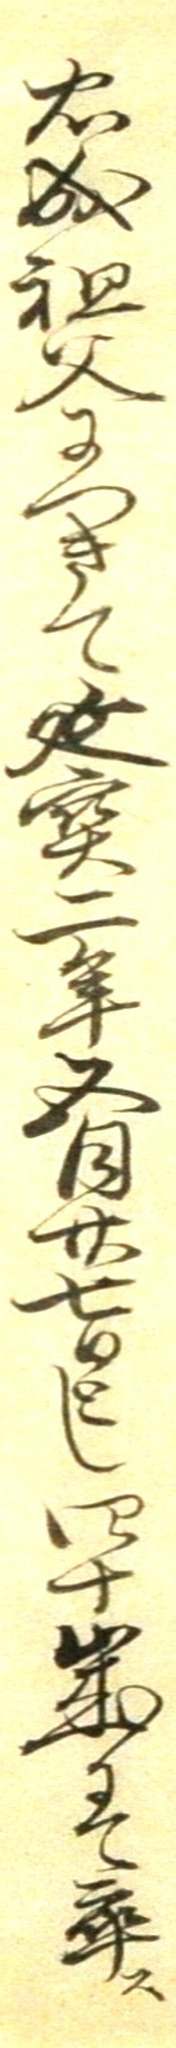忠成祖父につきて延宝二年五月廿七日とし四十歳にて卒ス
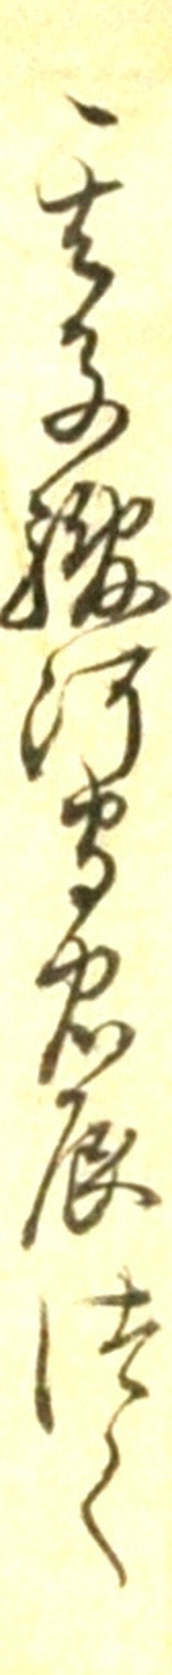其子駿河守忠辰つく
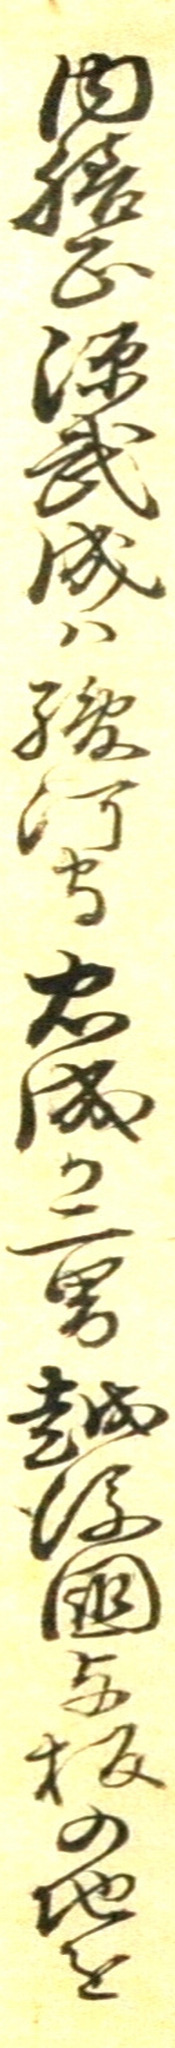内膳正源武成は駿河守忠成か二男越後国与板の地を

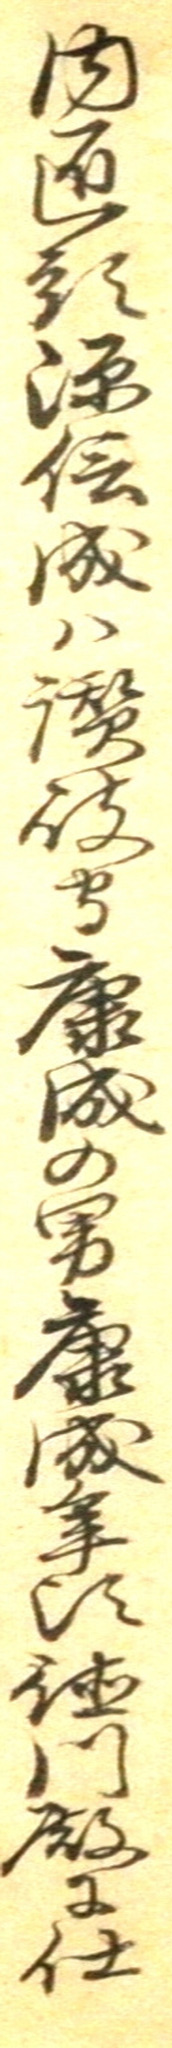内匠頭源信成は讃岐守康成の男康成年頃徳川殿に仕
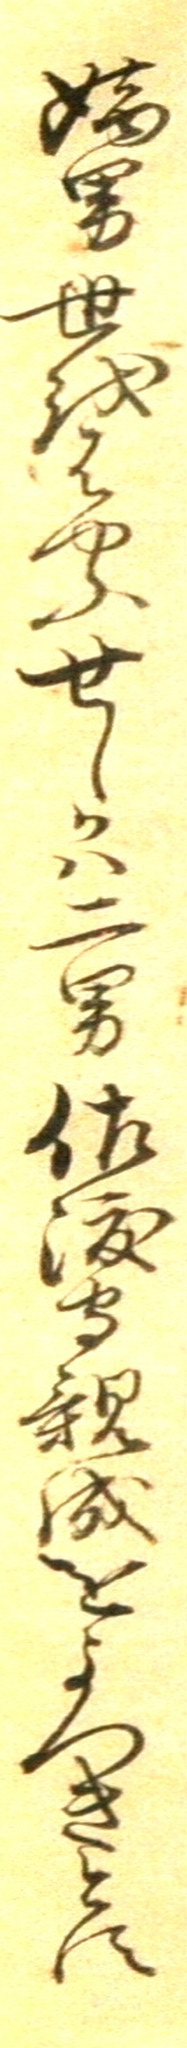嫡男世をはやふせしかは二男佐渡守親成をよつきとす

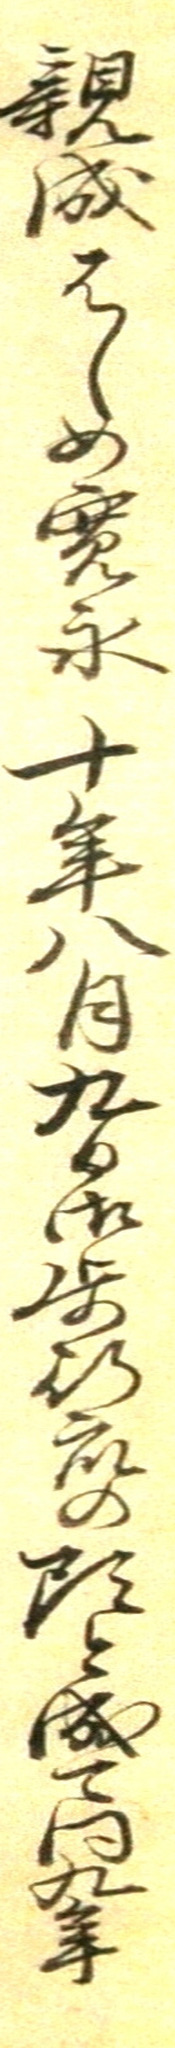親成はしめ寛永十年八月九日御歩行衆の頭と成て同九？年
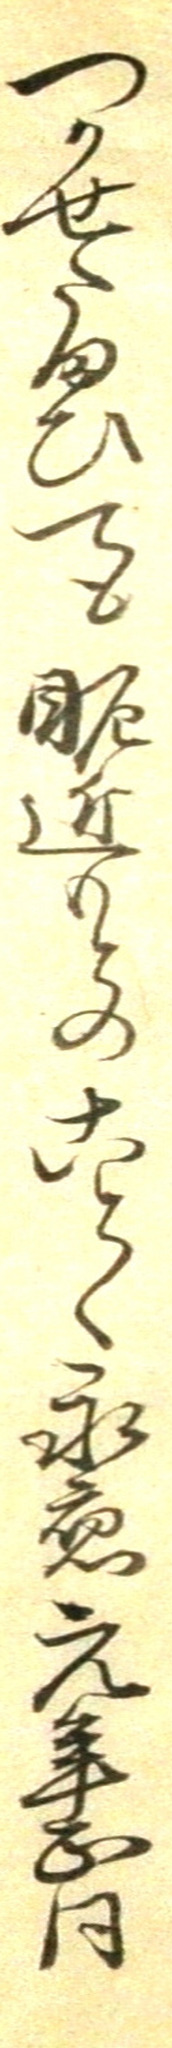つかせたまひても昵近もとのことく永応元年正月
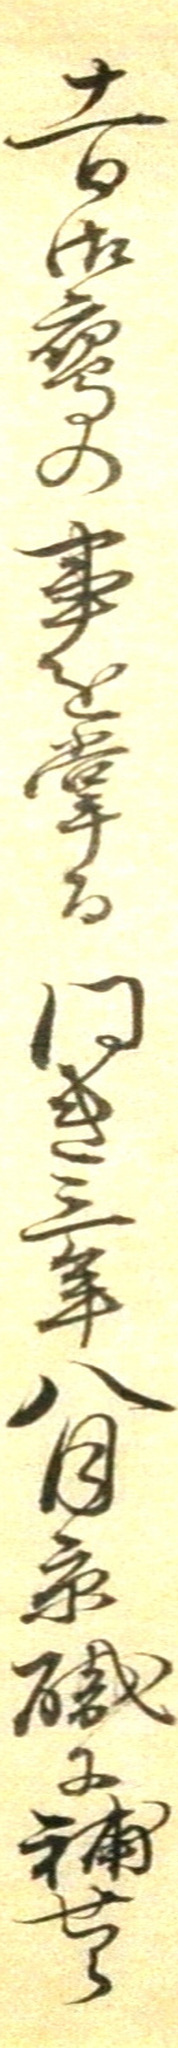十一日御鷹の事を掌る同き三年八月京職に補せら
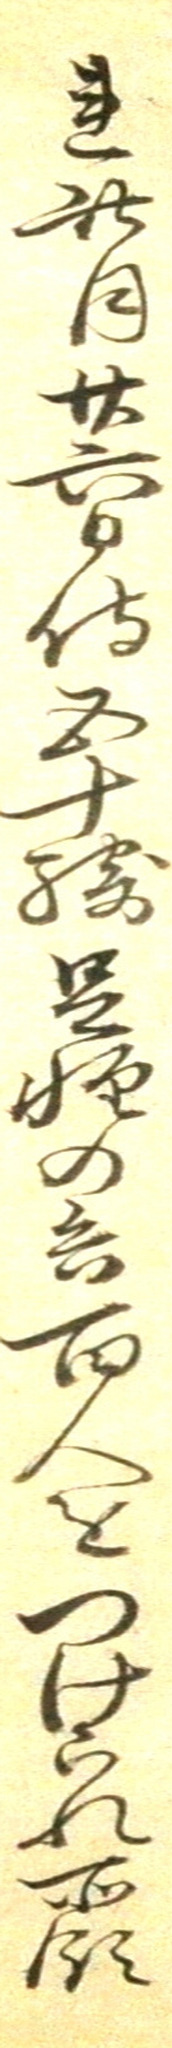れ此月廿六日侍五十騎足軽の兵百人をつけられ所領
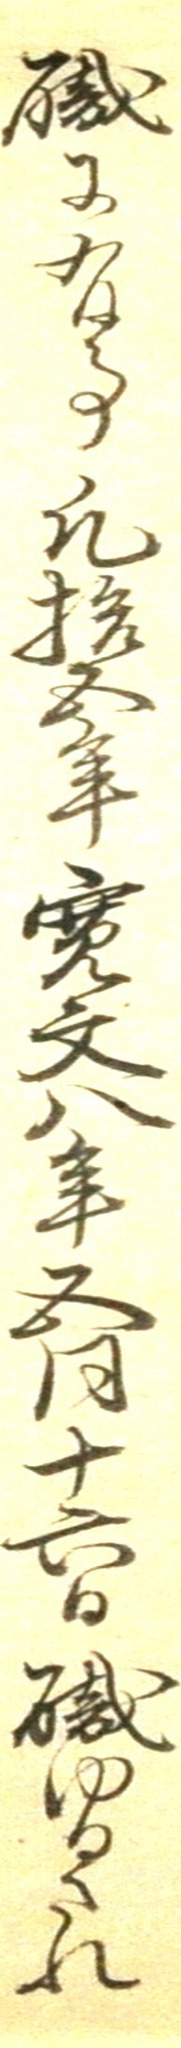職に有事凡拾五年寛文八年五月十六日職ゆるされ
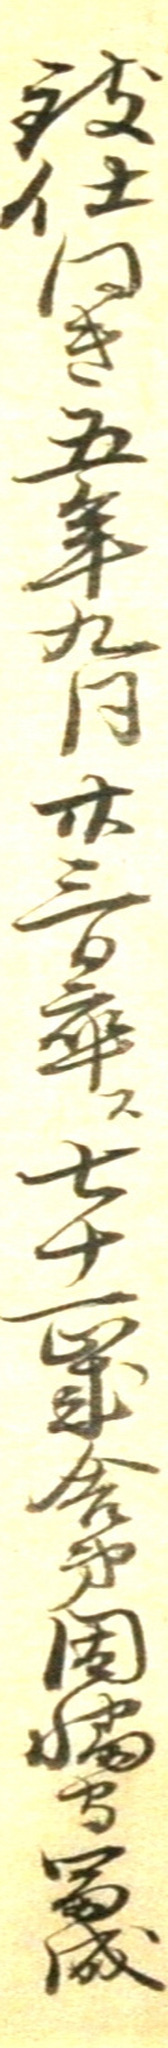致仕同き五年九月廿三日卒ス七十一歳舎弟因幡守富成
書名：藩翰譜（四・下）
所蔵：伊那市立高遠町図書館・合同会社AMANE
